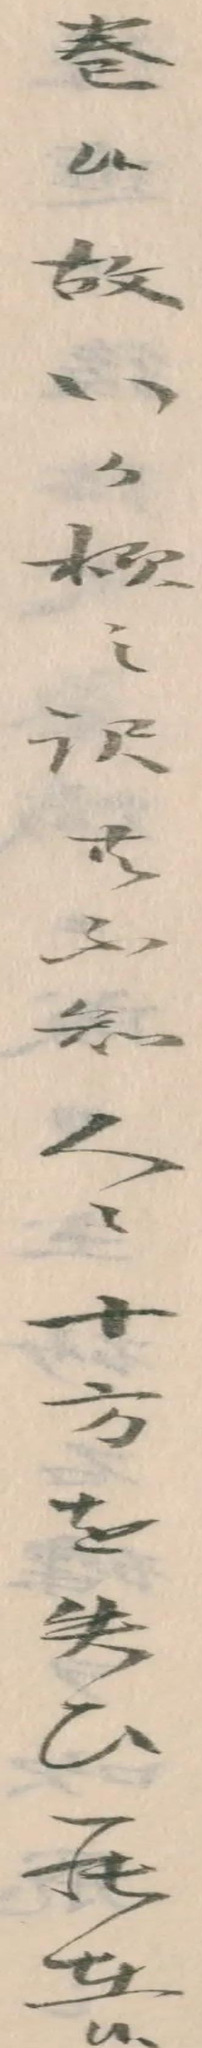巻候故いか様之訳共不知人々十方を失ひ罷在候
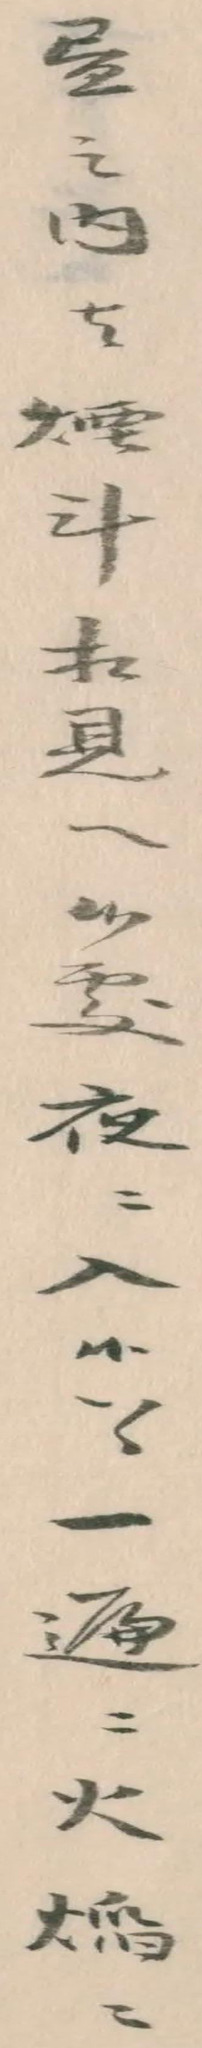昼之内は煙斗相見へ候處夜に入候はゝ一遍に火㷔に
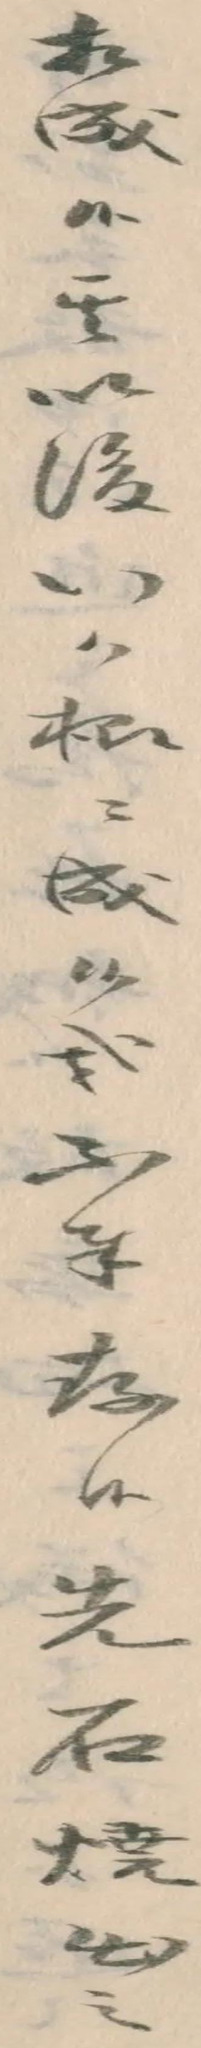相成候其以後いか様に成候哉不奉存候先石焼出之

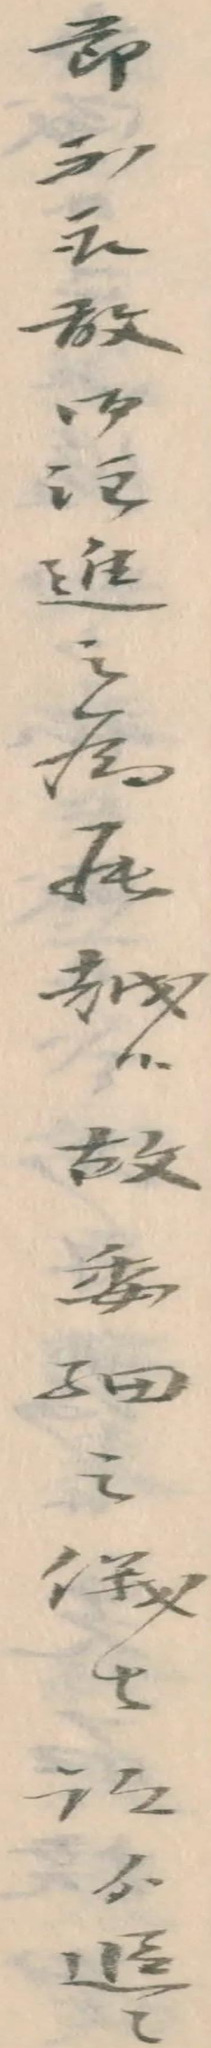節不取敢御注進之為罷越候故委細之儀は跡ゟ追々
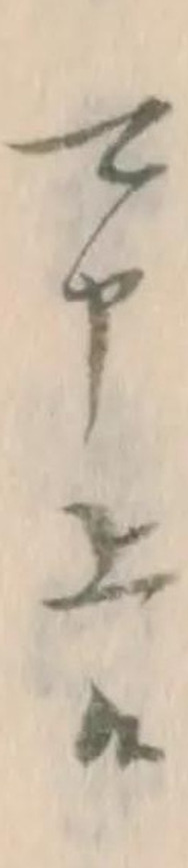可申上候
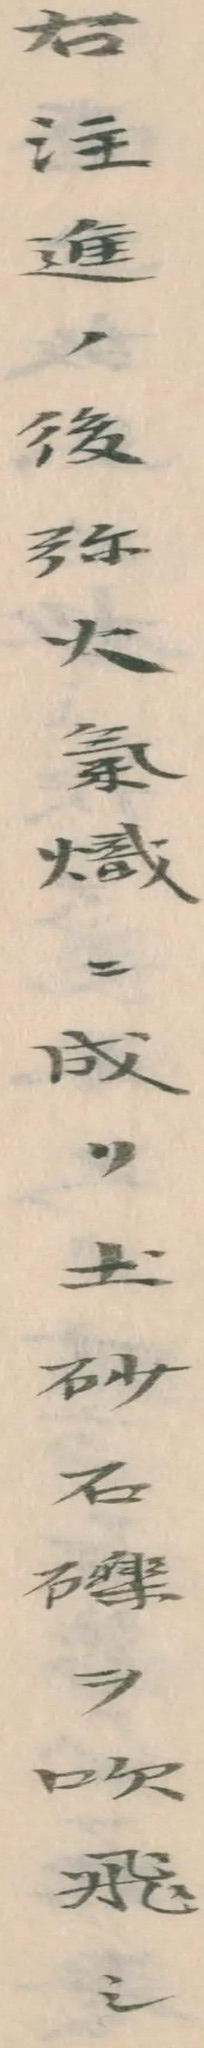右注進ノ後弥火氣熾ニ成リ土砂石礫ヲ吹飛シ
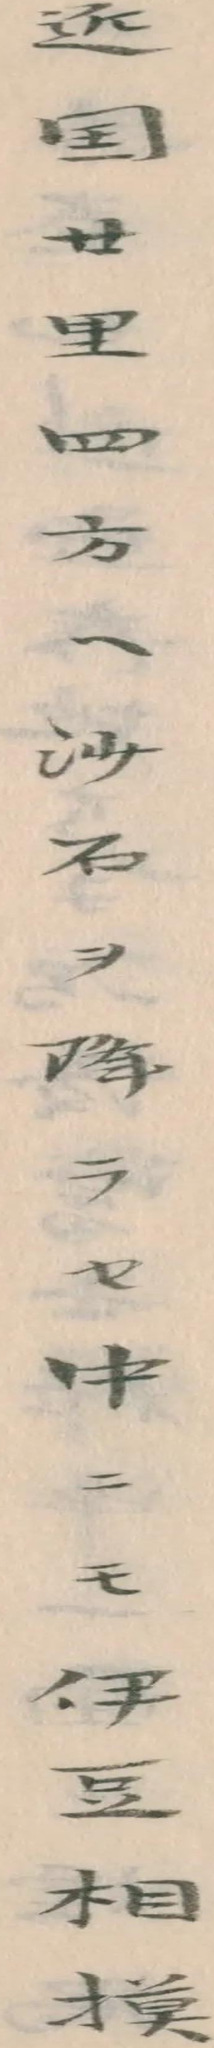近国廿里四方ヘ沙石ヲ降ラセ中ニモ伊豆相模
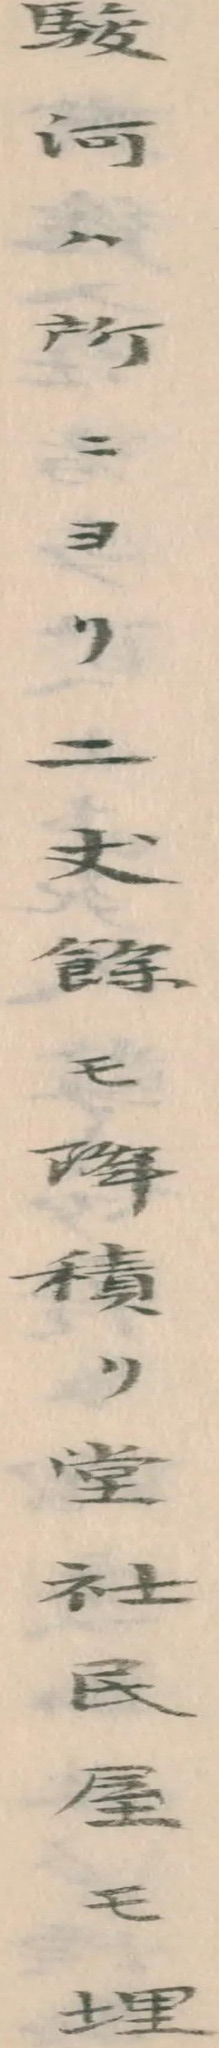駿河ハ所ニヨリ二丈餘モ降積リ堂社民屋モ埋
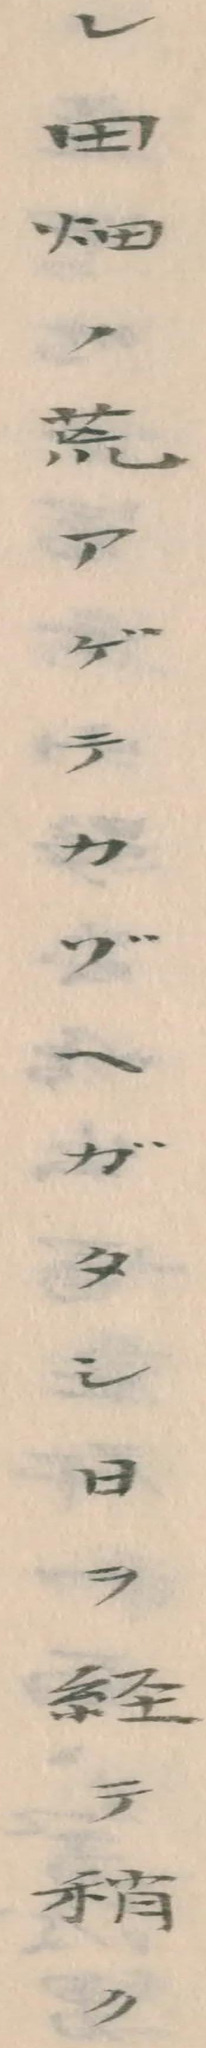レ田畑ノ荒アゲテカゾヘガタシ日ヲ経テ稍ク
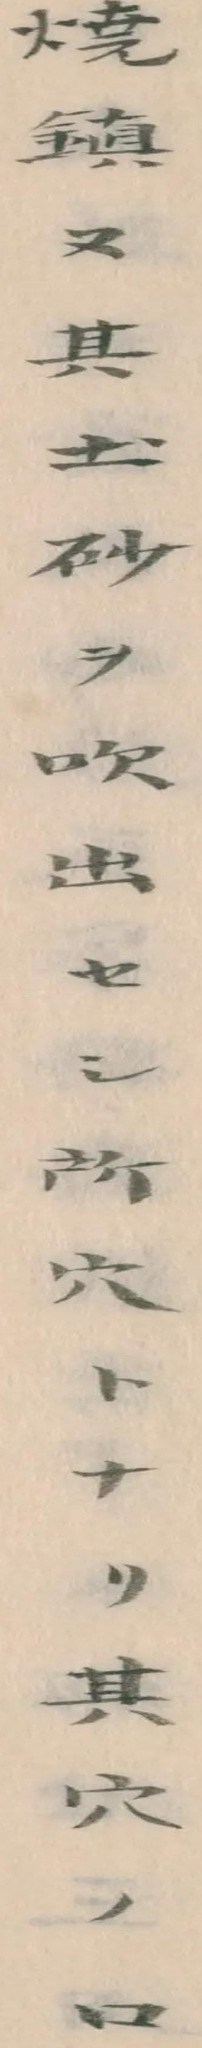焼鎭ヌ其土砂ヲ吹出セシ所穴トナリ其穴ノ口
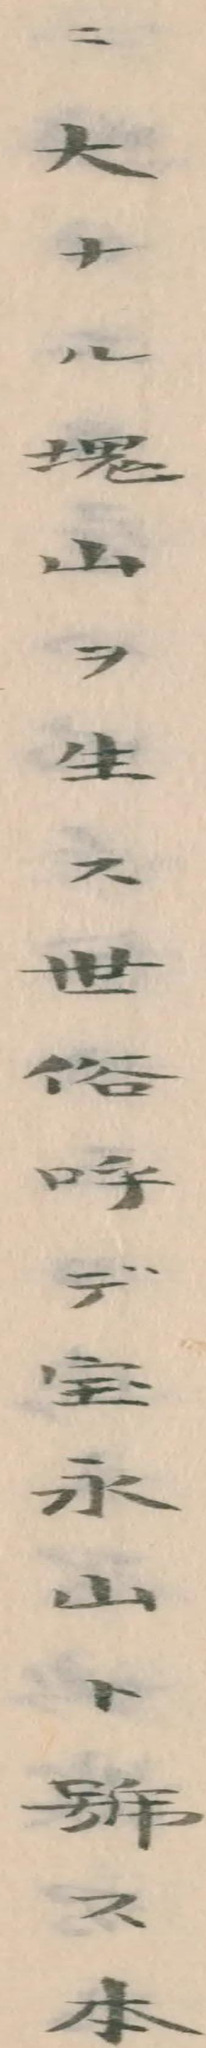ニ大ナル塊山ヲ生ス世俗呼デ宝永山ト號ス本
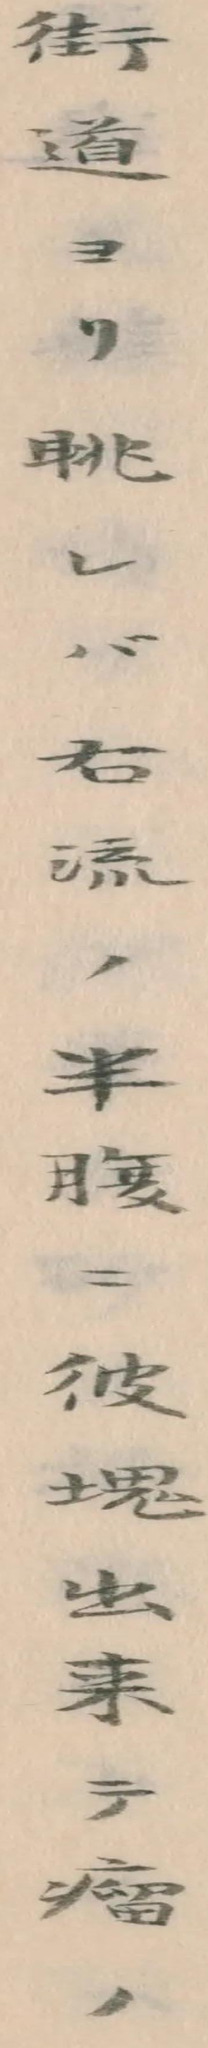街道ヨリ眺レバ右流ノ半腹ニ彼塊出来テ瘤ノ
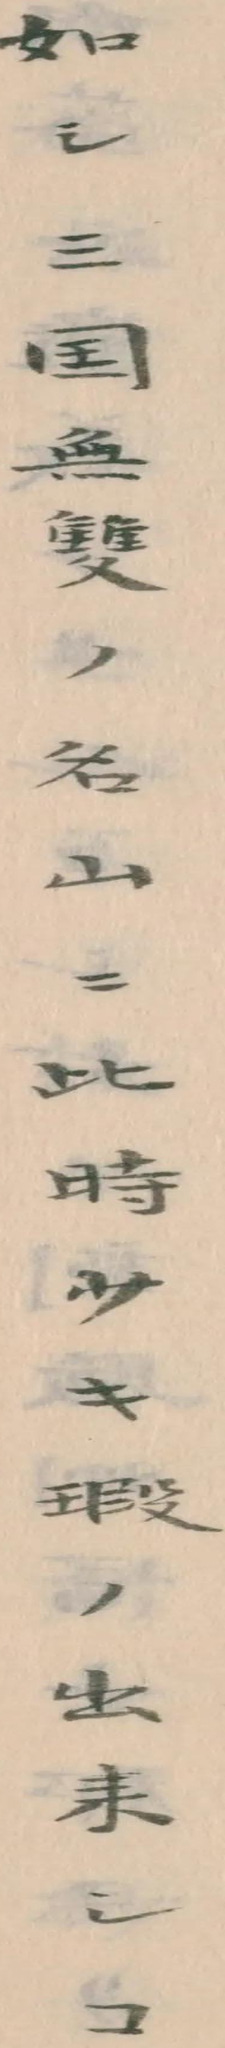如シ三国無雙ノ名山ニ此時少キ瑕ノ出来シコ
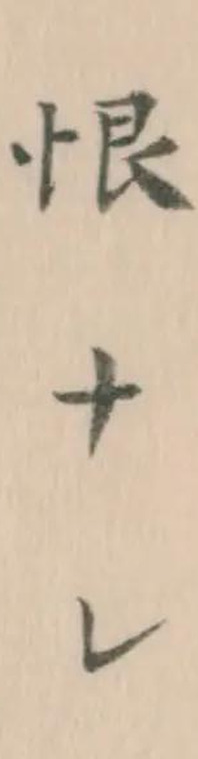恨ナレ

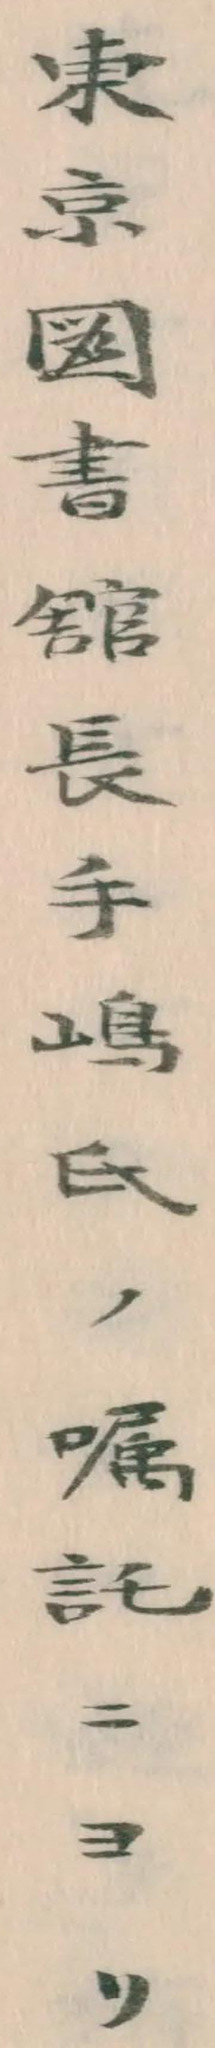東京図書舘長手嶋氏ノ嘱託ニヨリ
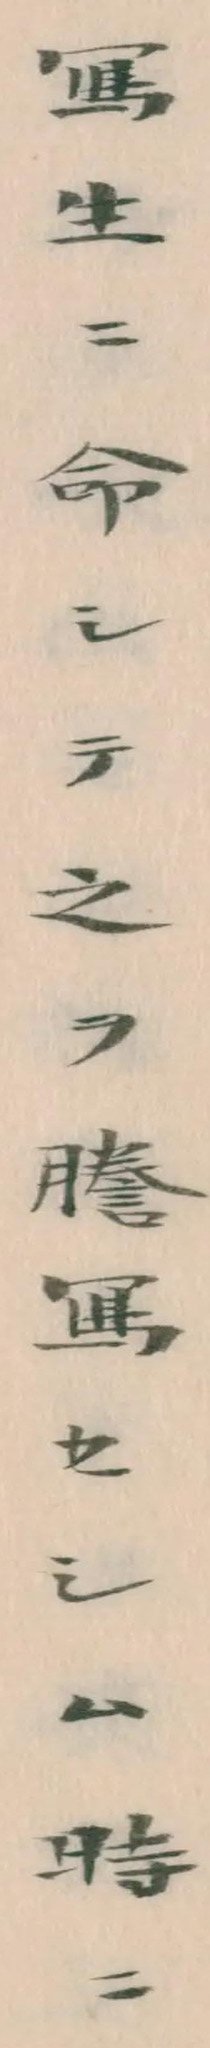写生に命シテ之ヲ謄写セシム時ニ
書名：地災撮要. 巻11-12(地震之部)
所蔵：国立国会図書館 National Diet Library, JAPAN
